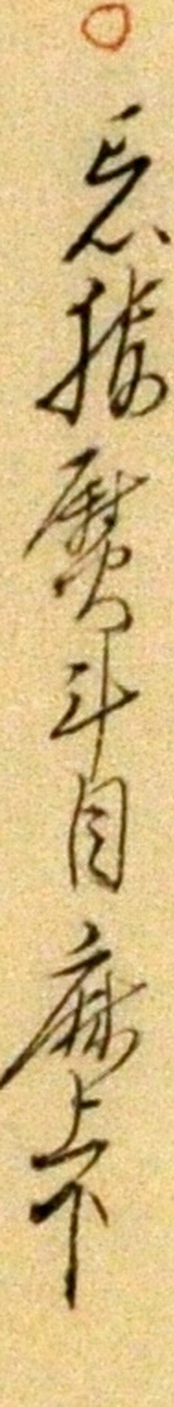着服熨斗目麻上下
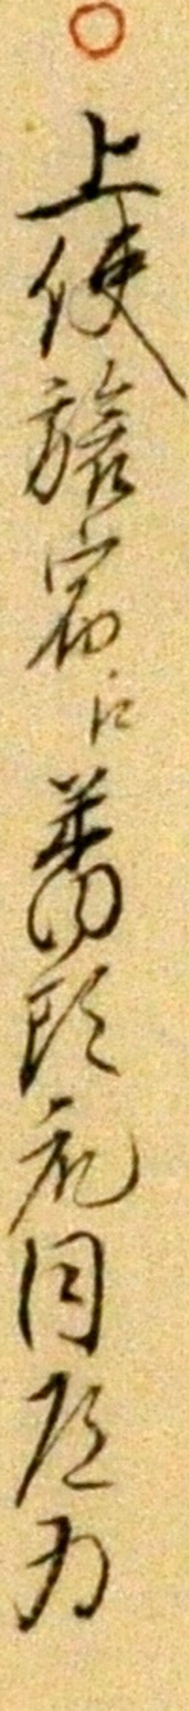上使旅宿え番頭衆同道為
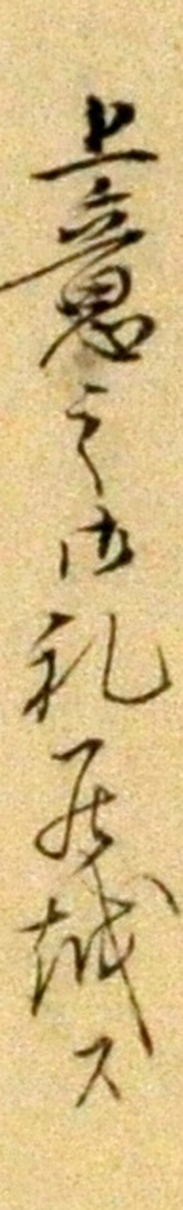上意之御礼罷越ス
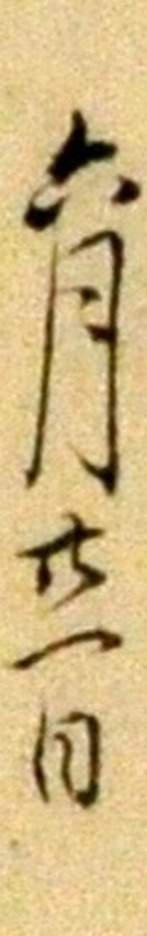六月廿一日
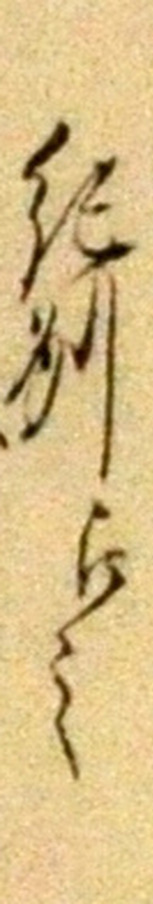紀州え之
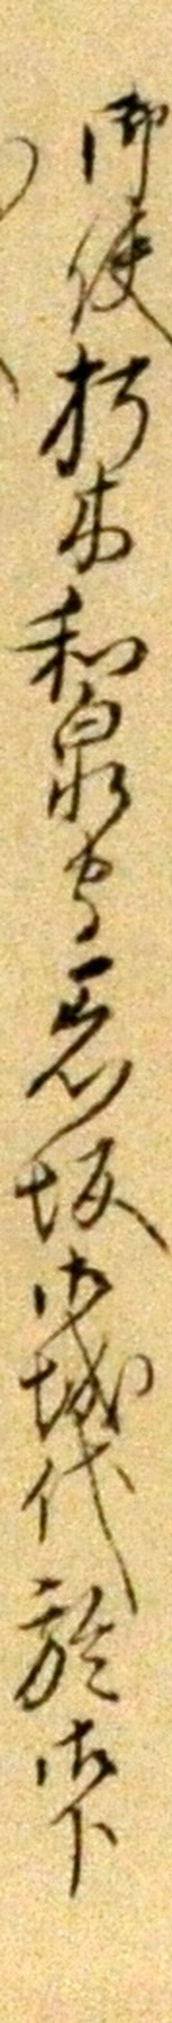御使朽木和泉守着坂御城代於御下
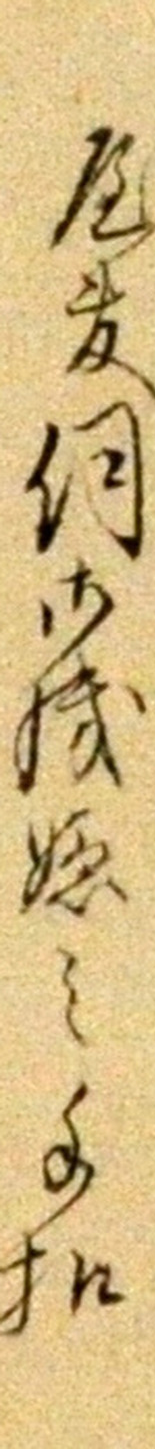屋敷伺御機嫌之手扣
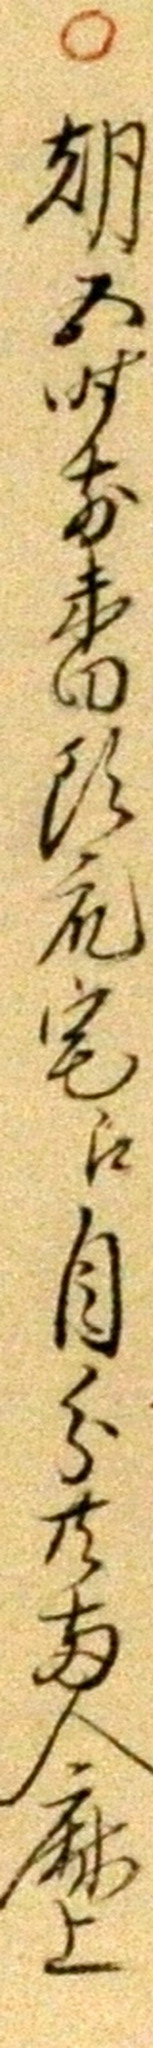朝五時前番頭衆宅え自分共両人麻上
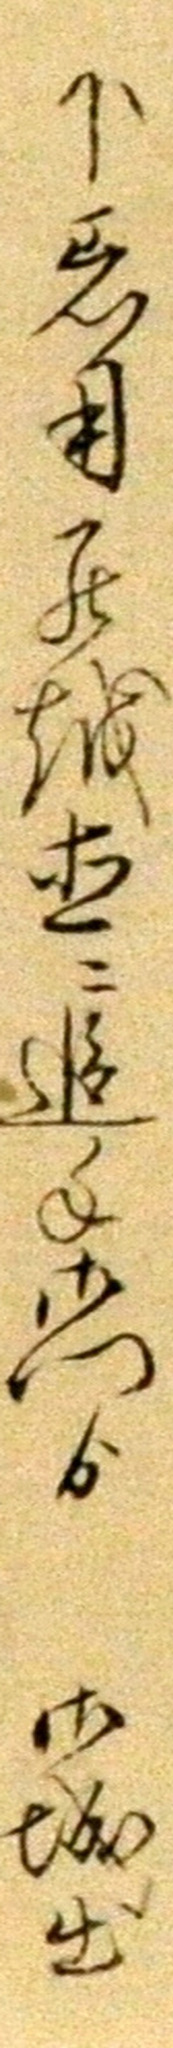下着用罷越直ニ追手御門ゟ御城出
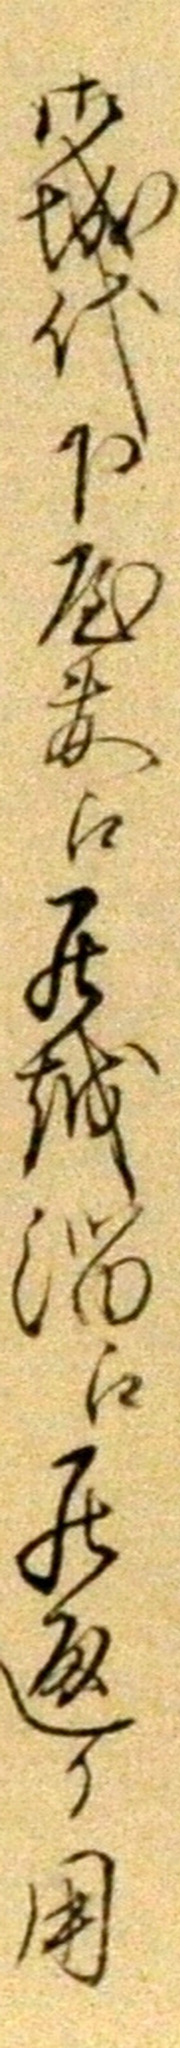御城代下屋敷え罷越溜え罷通り用
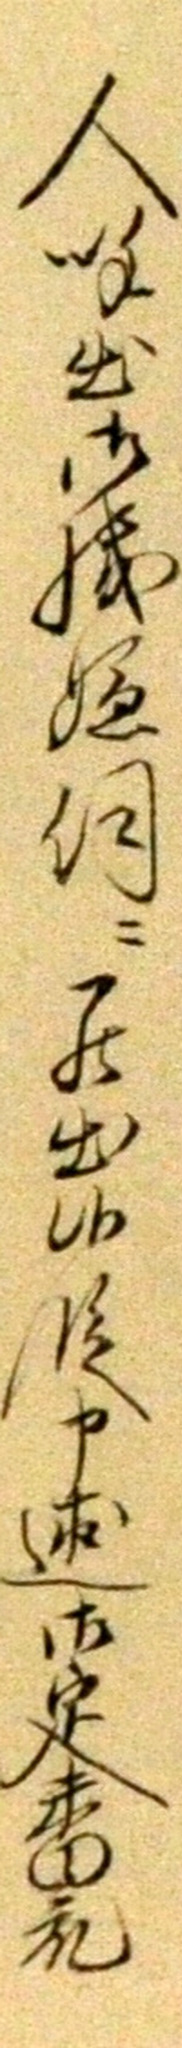人呼出御機嫌伺ニ罷出候段申述御定番衆
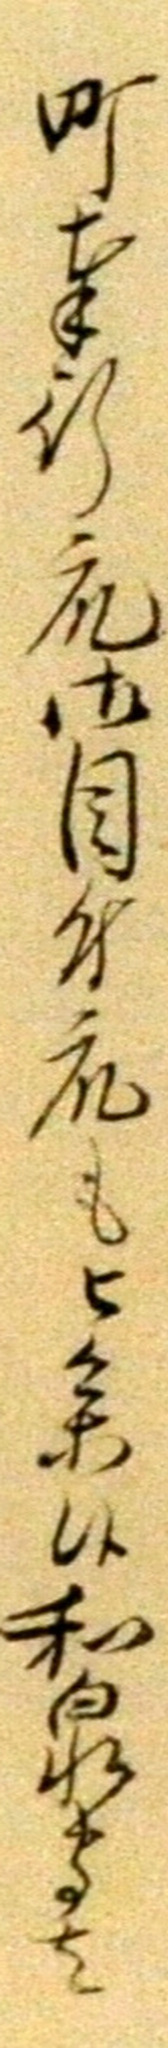町奉行衆御目付衆も被参候和泉守は
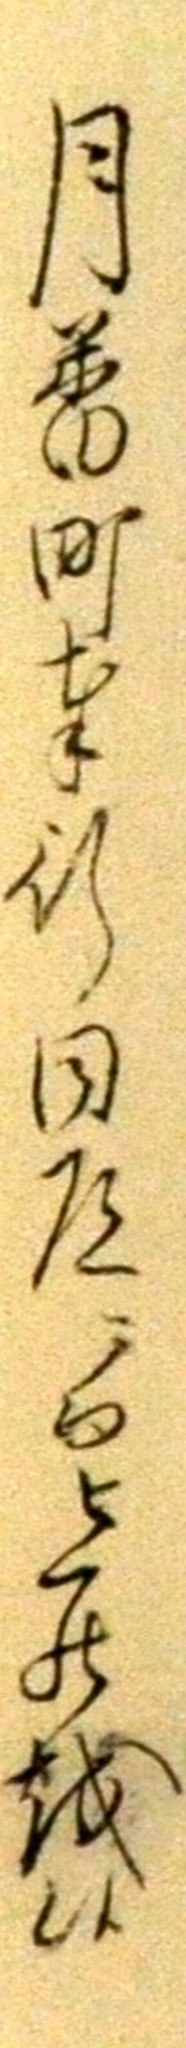月番町奉行同道ニ而被罷越候

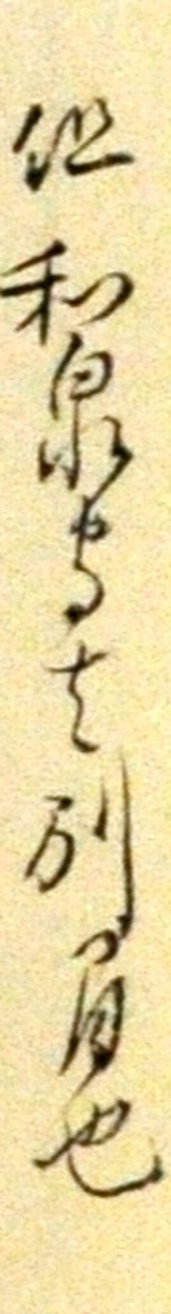但和泉守は別間也
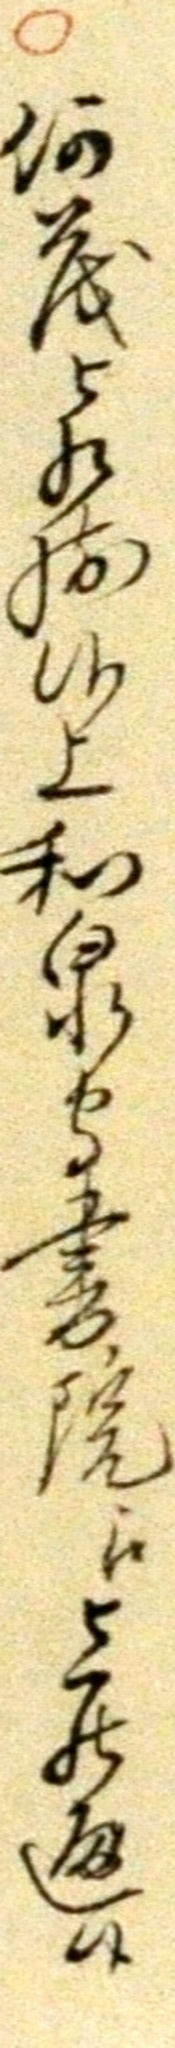何も被相揃候上和泉守書院え被罷通候
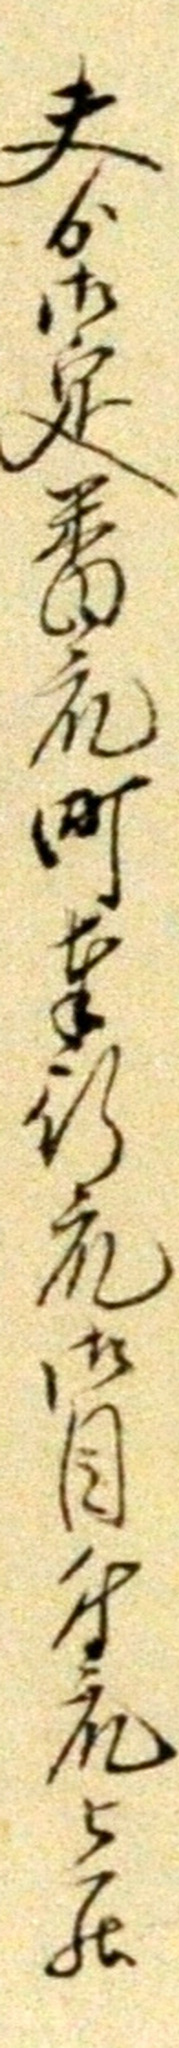夫ゟ御定番衆町奉行衆御目付衆被罷
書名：大阪加番関係諸書留〔一括〕
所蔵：伊那市立高遠町図書館・合同会社AMANE
